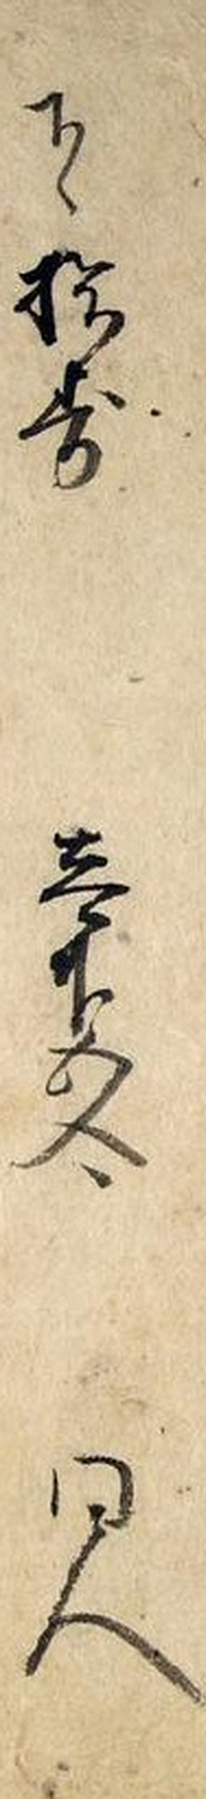下々拾歩壱升五合同人
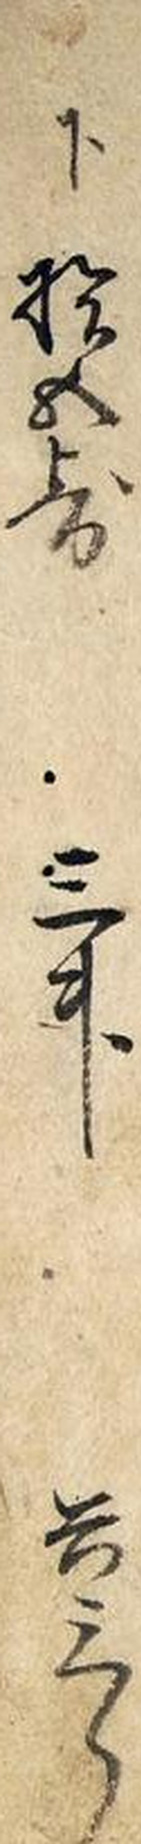下拾五歩三升兵三郎

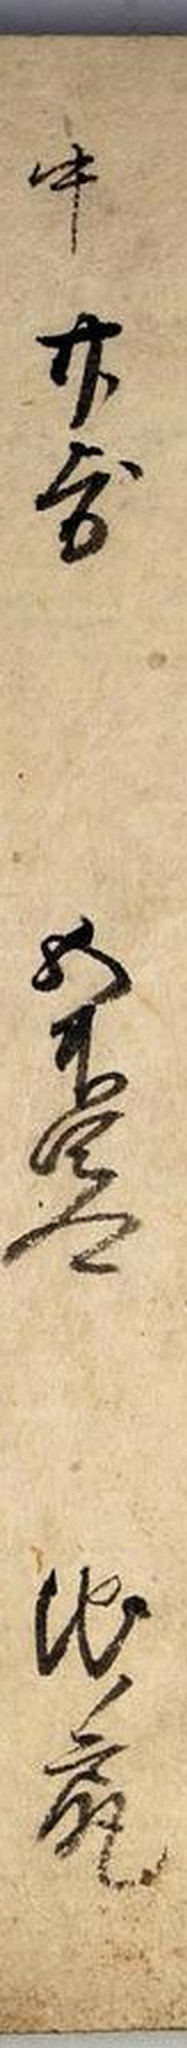中廿歩五升四合池ノ尻
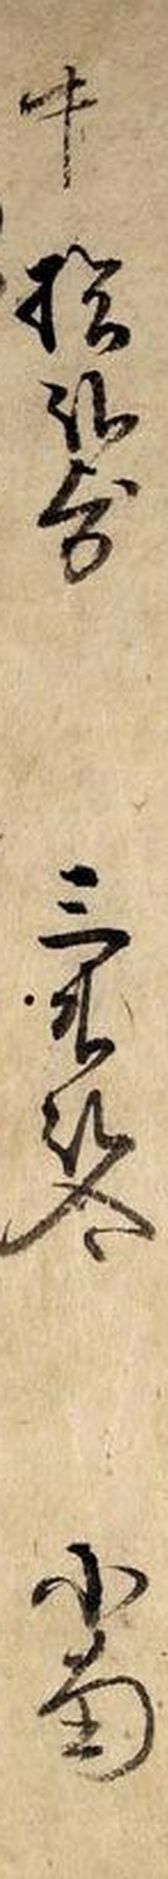中拾弐歩三升弐合小南
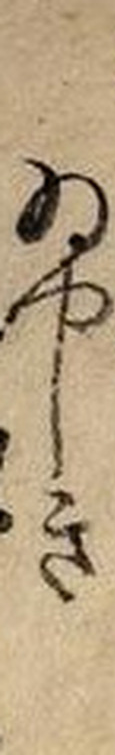ゐやしき
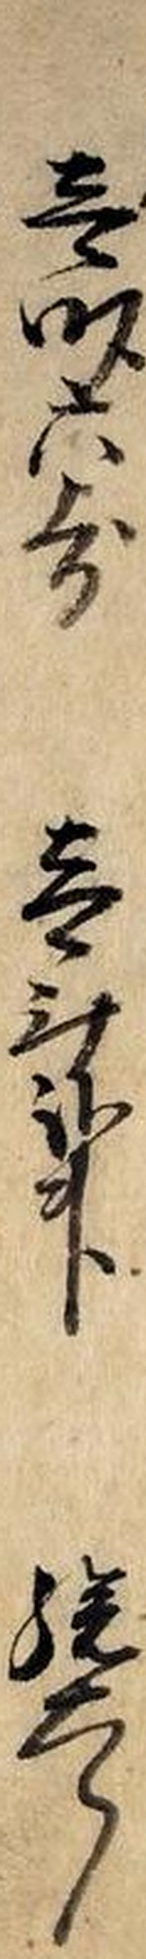壱畝六歩壱斗二升孫大郎
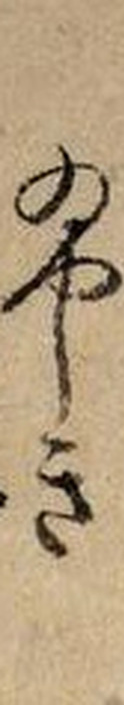ゐやしき
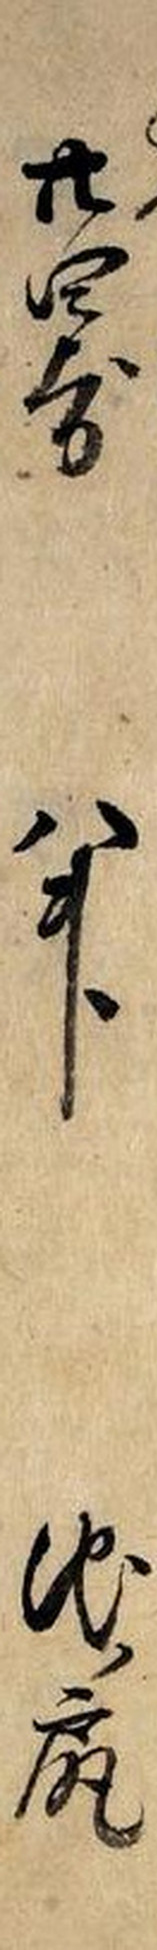廿四歩八升池ノ尻
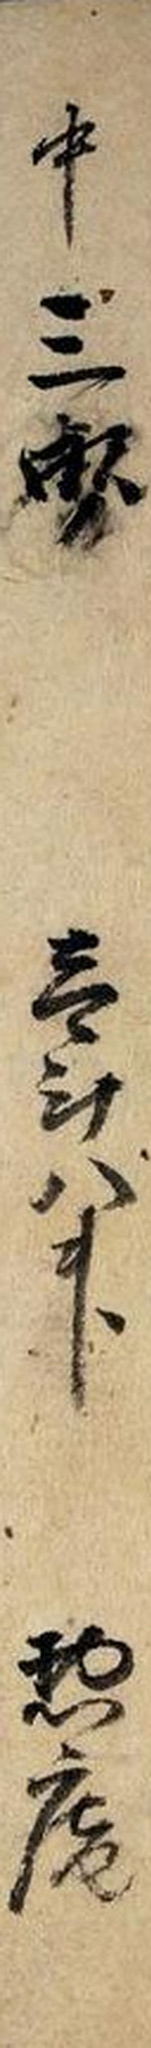中三畝壱斗八升惣庵
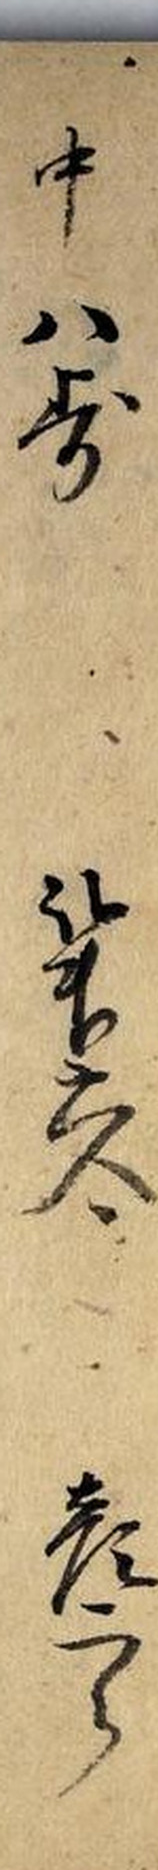中八歩弐升六合彦二郎
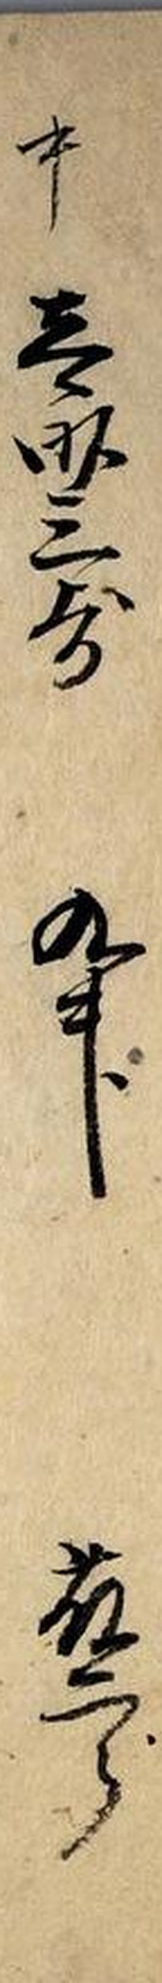中壱畝三歩九升藤二郎
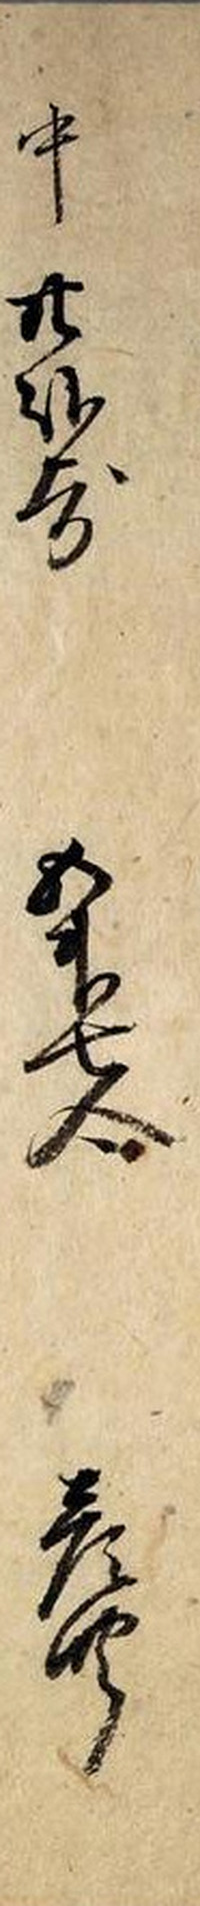中廿弐歩五升七合彦四郎
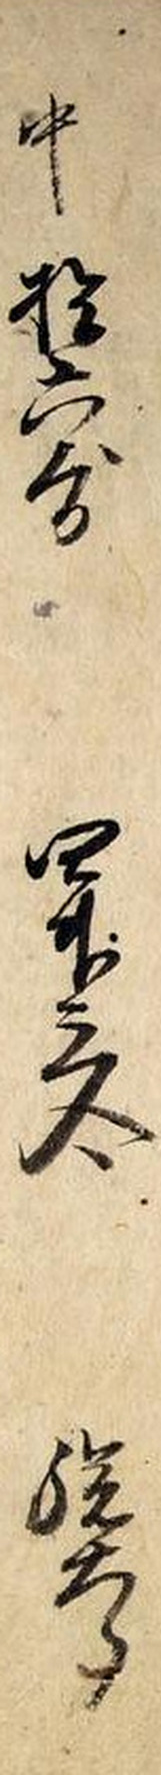中拾六歩四升三合孫大郎
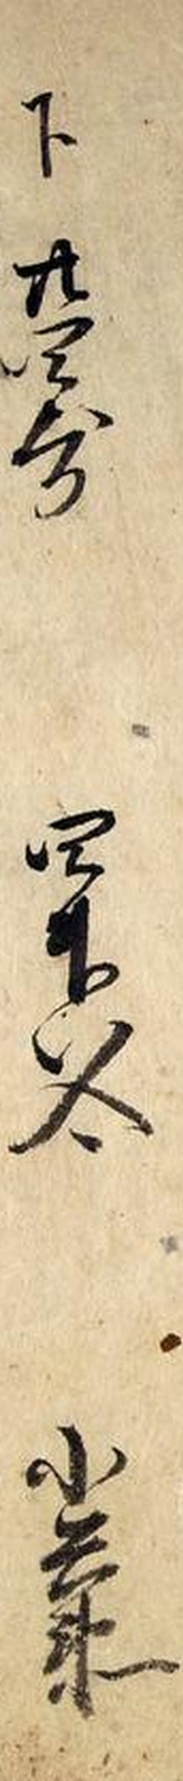下廿四歩四升八合小兵衛
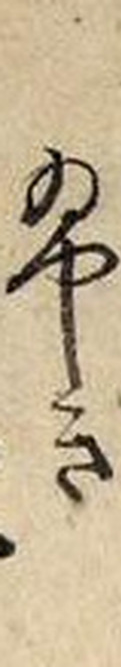ゐやしき
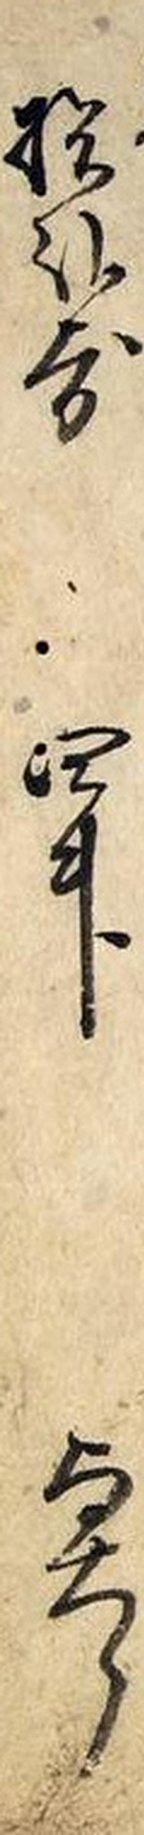拾弐歩四升与大郎
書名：若州三方郡之内世久見浦御検地帳（世久見浦検地帳写）
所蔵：福井県文書館 Fukui Prefectural Archives
